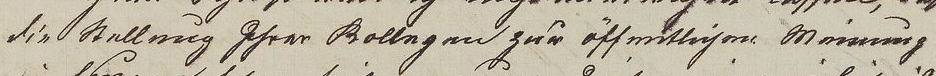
die Stellung Ihrer Kollegen zur öffentlichen Meinung
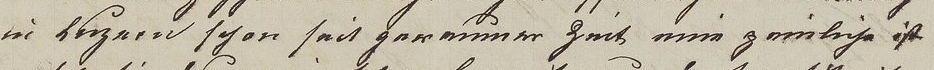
in Luzern schon seit geraumer Zeit eine peinliche ist
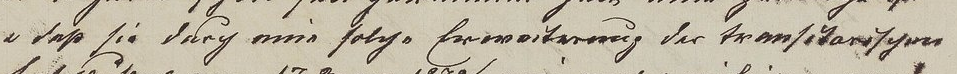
& daß sie durch eine solche Erweiterung des transitorischen
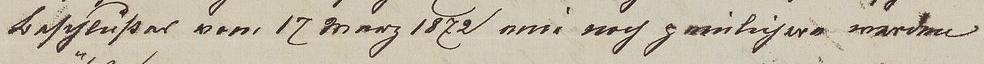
Beschlußes vom 17. Merz 1872 eine noch peinlichere werden
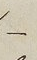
–
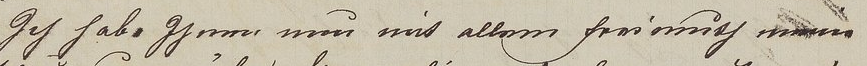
Ich habe Ihnen nun mit allem Freimuth meine
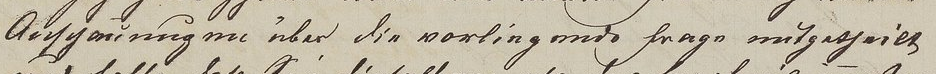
Anschauungen über die vorliegende Frage mitgetheilt
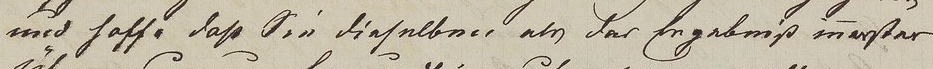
und hoffe daß Sie dieselben als das Ergebniß innerster
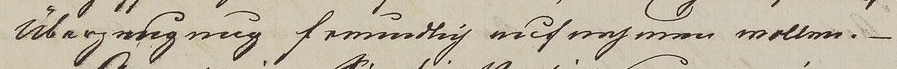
Überzeugung freundlich aufnehmen wollen.
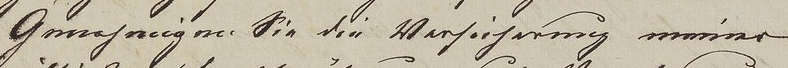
Genehmigen Sie die Versicherung meiner
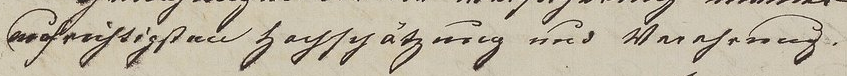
aufrichtigsten Hochschätzung und Verehrung.
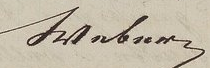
Weber
